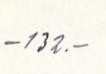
132
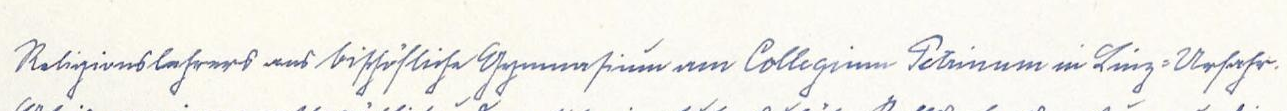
Religionslehrers ans bischöfliche Gymnasium am Collegium Petrinum in Linz- Urfahr.
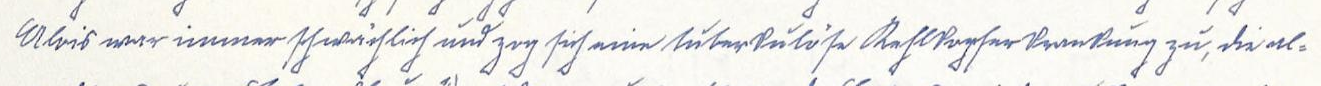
Alois war immer schwächlich und zog sich eine tuberkulöse Kehlkopferkrankung zu, die al-
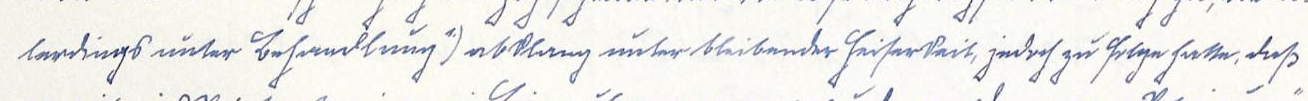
lerdings unter Behandlung 1) abklang, unter bleibender Heiterkeit, jedoch zu Folge hatte, daß
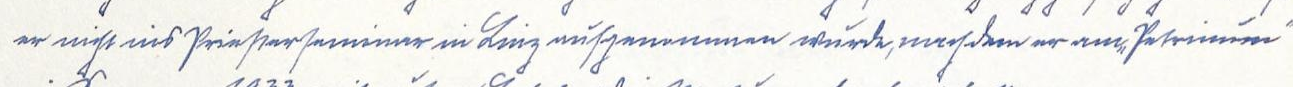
er nicht ins Priesterseminar in Linz aufgenommen wurde, nachdem er am Petrinum
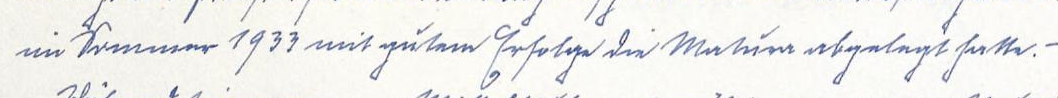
im Sommer 1933 mit gutem Erfolge die Matura abgelegt hatte.
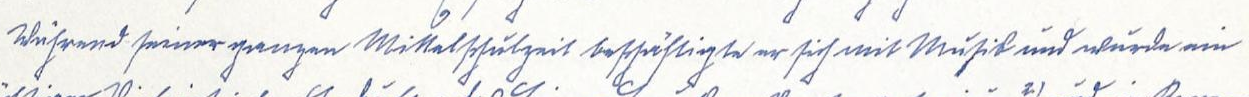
Während seiner ganzen Mittelschulzeit beschäftigt eer sich mit Musik und wurde ein
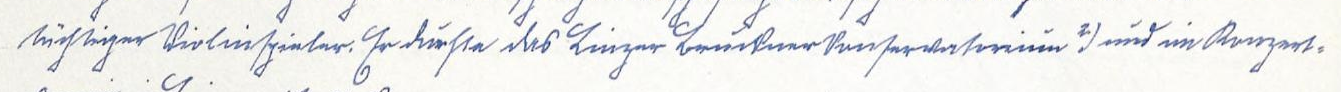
tüchtiger Violinspieler. Er durfte Das Linzer Brucknerkonservatorium 2) und im Konzert-
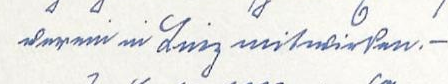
verein in Lienz mitwirken.-
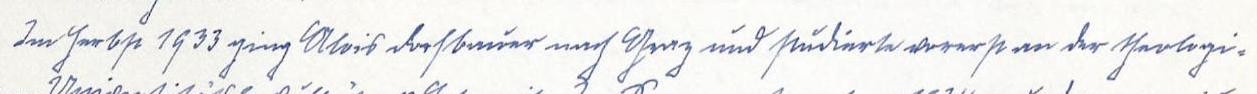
Im Herbst 1933 ging Alois Dorfbauer nach Graz und studierte vorerst an der theolgi-
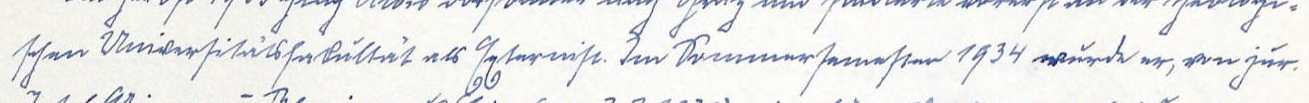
schen Universitätsfakultät als Externist. Im Sommersemester 1934 wurde er, von jur.
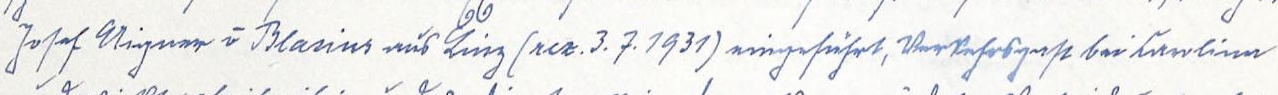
Josef Aigner v/o Blasius aus Linz (rez. 3. 7. 1931) eingeführt, Verkehrsgast bei Carolina
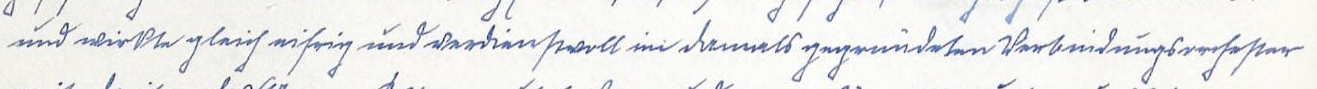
und wirkte gleich eifrig und verdienstvoll im damals gegründeten Verbindungsorchester
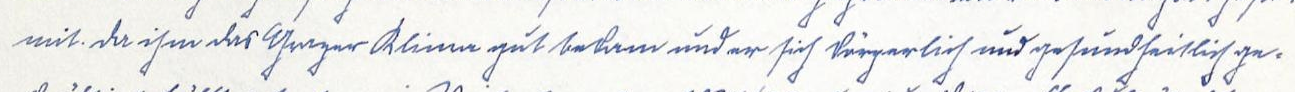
mit. Da ihm das Grazer Klima gut bekam und er sich körperlich und gesundheitlich ge-
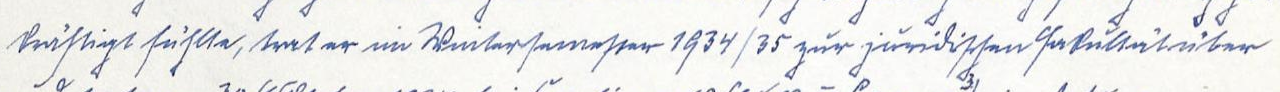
kräftigt fühlte, trat er im Wintersemester 1934/ 35 zur juridischen Fakultät über
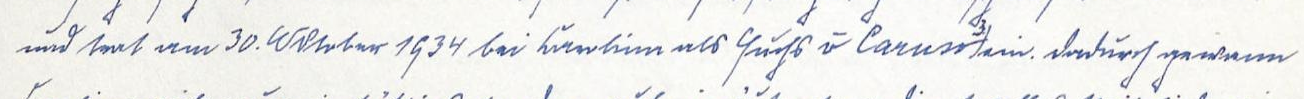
und trat am 30. Oktober 1934 bei Carolina als Fuchs v/o Caruso ein. Dadurch gewann
